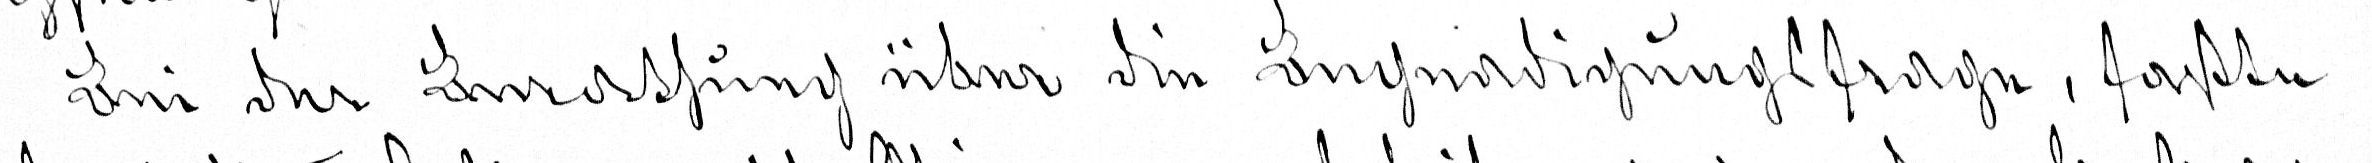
Bei der Berathung über die Begnadigungsfrage, faßte
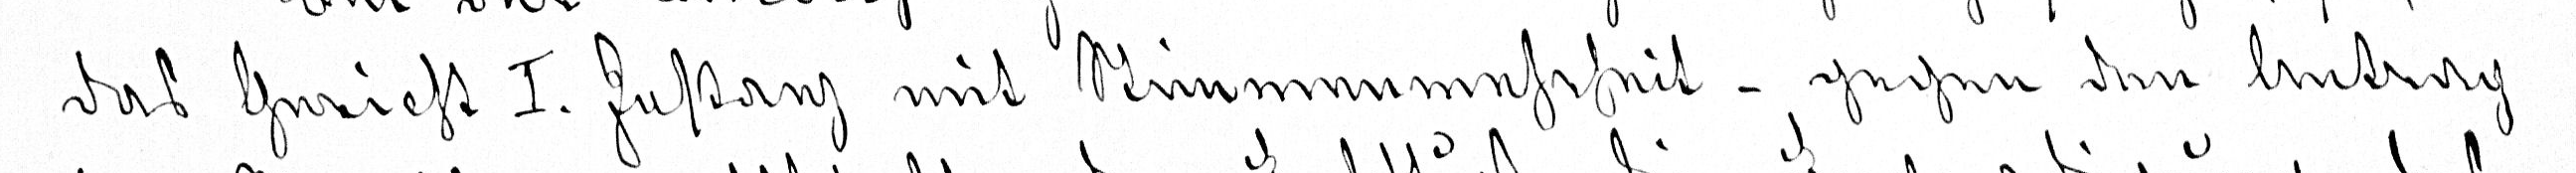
das Gericht I. Instanz mit Stimmenmehrheit - gegen den Antrag
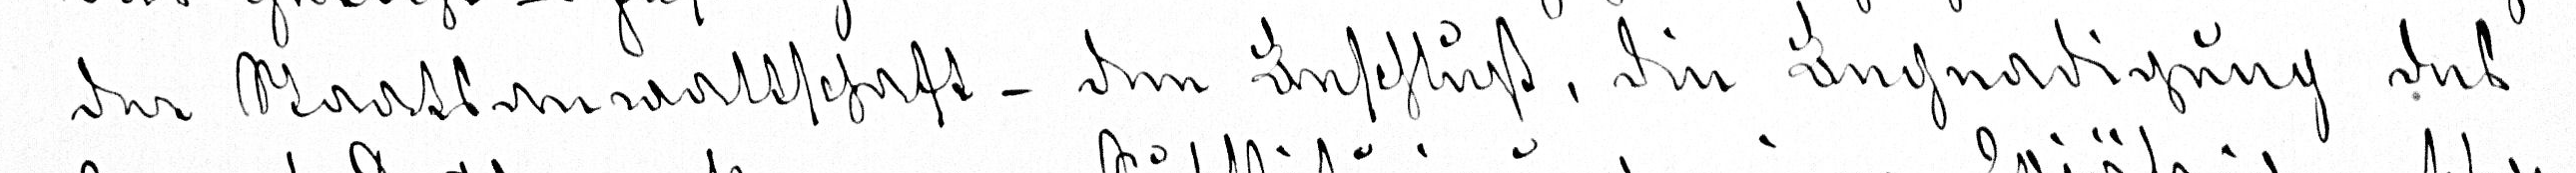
der Staatsanwaltschaft - den Beschluß, die Begnadigung des
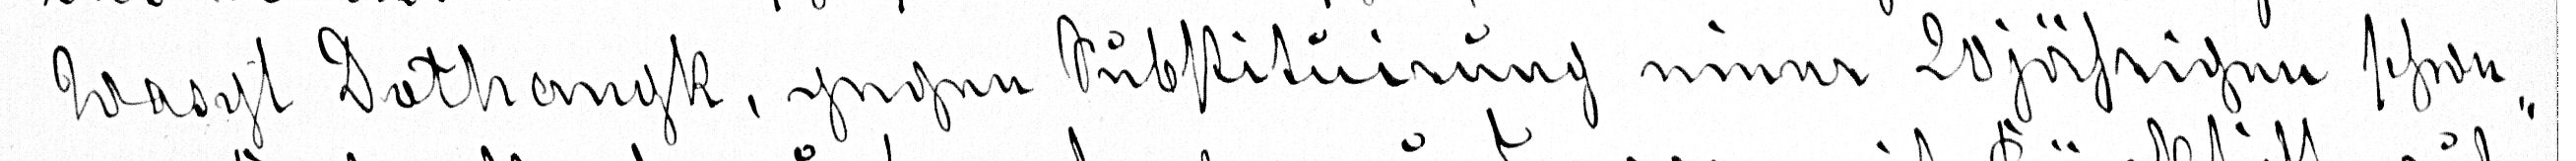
Wasyl Dothanyk, gegen Substituirung einer 20jährigen schwe¬
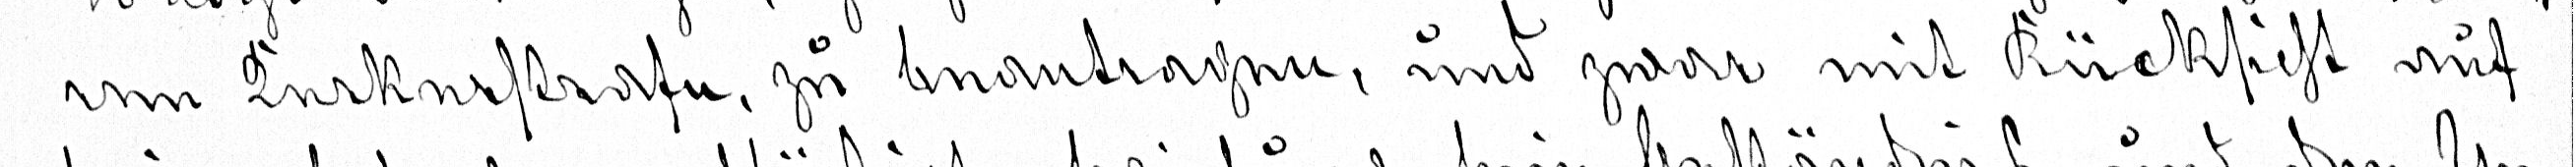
ren Kerkerstrafe, zu beantragen, und zwar mit Rücksicht auf
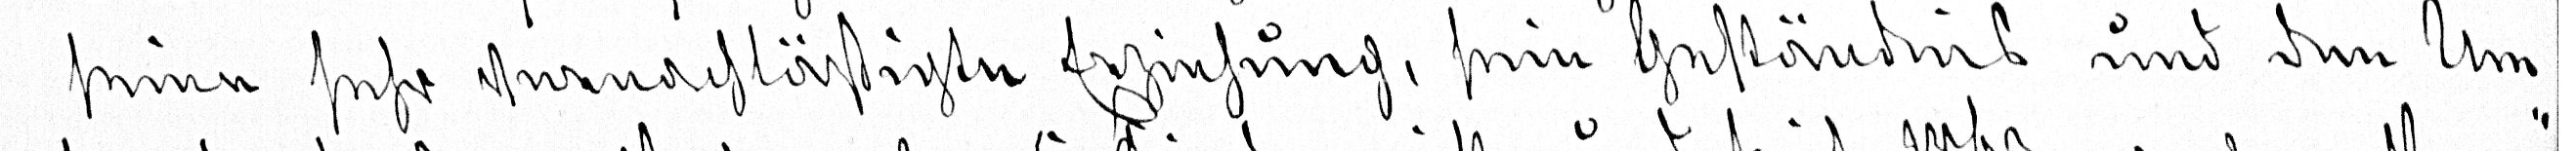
seine sehr Vernachläßigte Erziehung, sein Geständnis und den Um¬
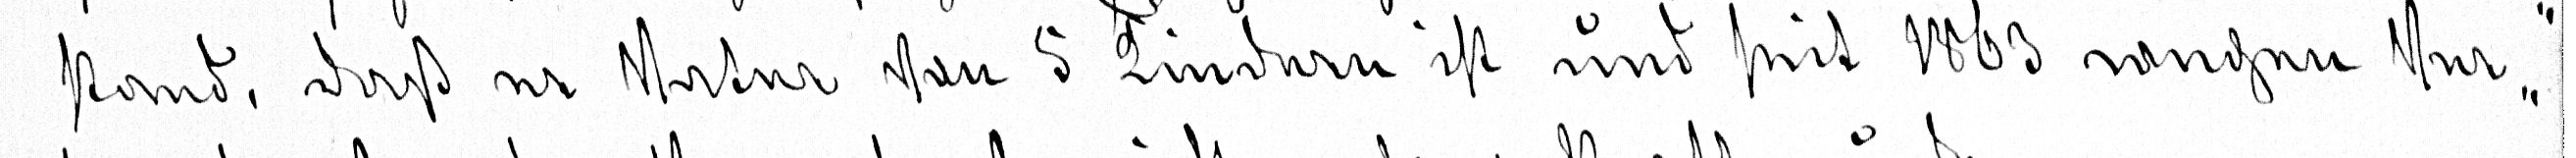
stand, daß er Vater von 5 Kindern ist und seit 1863 wegen Ver¬
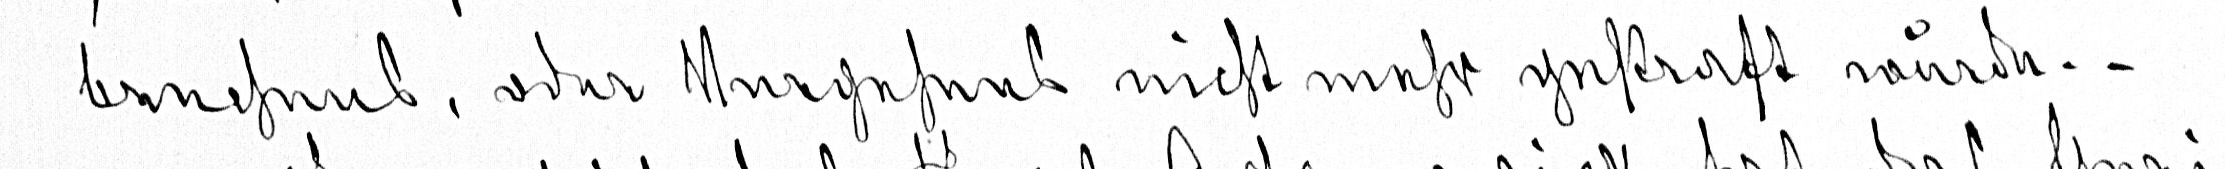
brechens, oder Vergehens nicht mehr gestraft wurde.-
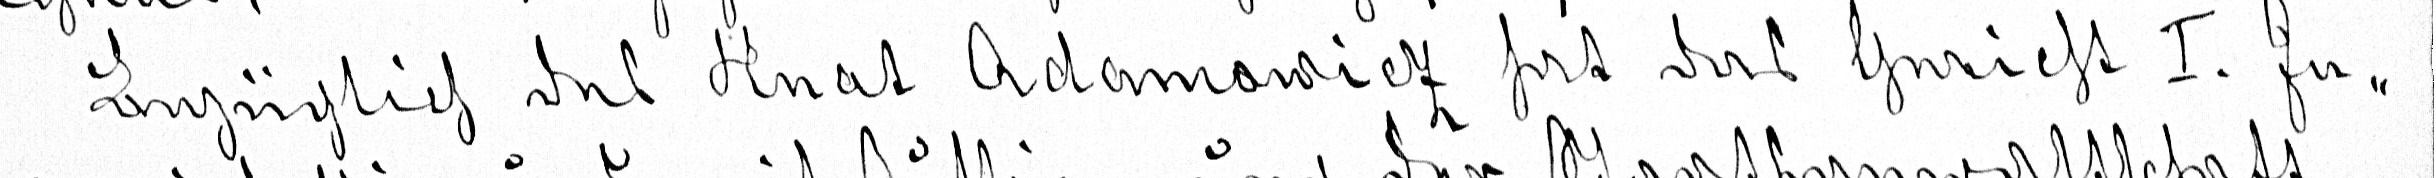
Bezüglich des Hnat Adamowicz hat das Gericht I. In¬
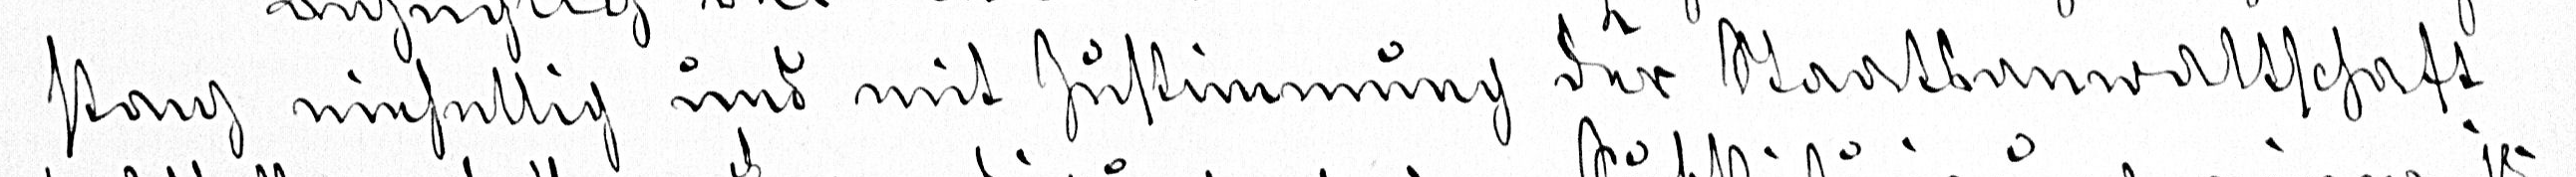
stanz einhellig und mit Zustimmung der Staatsanwaltschaft
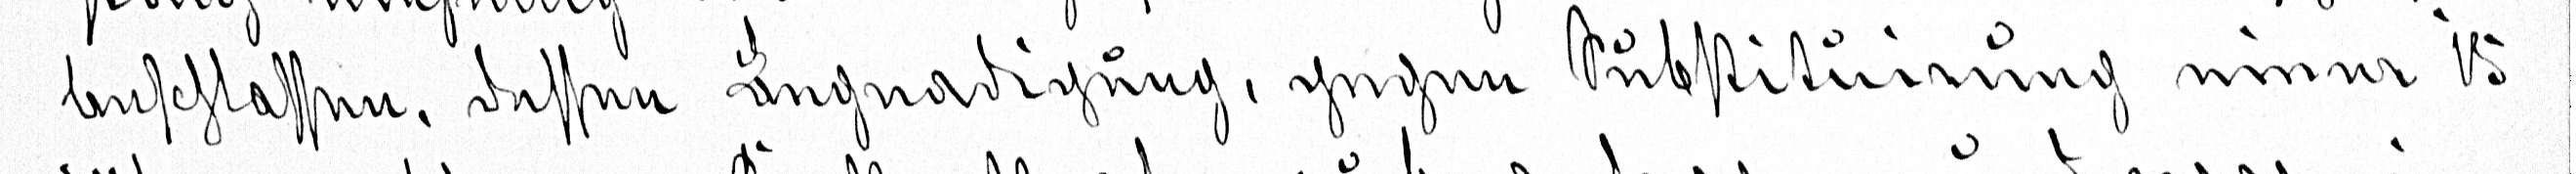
beschlossen, dessen Begnadigung, gegen Substituirung einer 15
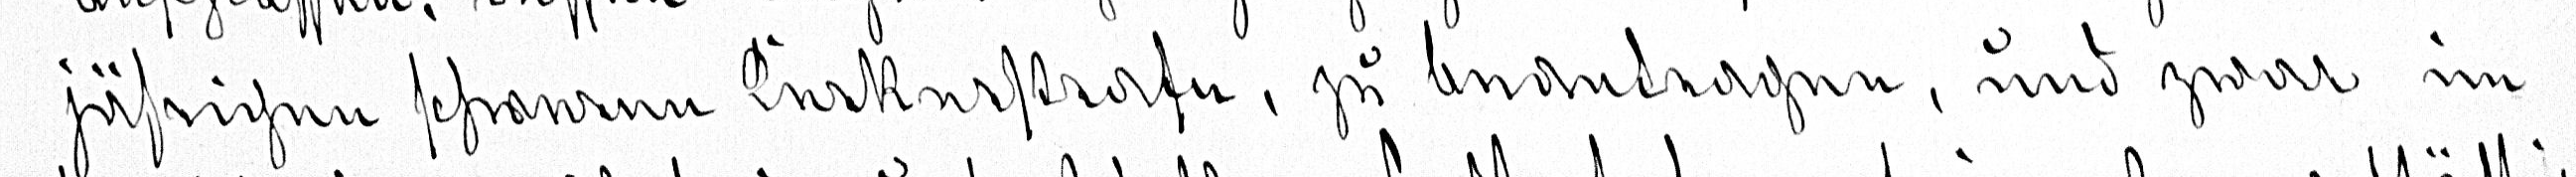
jährigen schweren Kerkerstrafe, zu beantragen, und zwar im
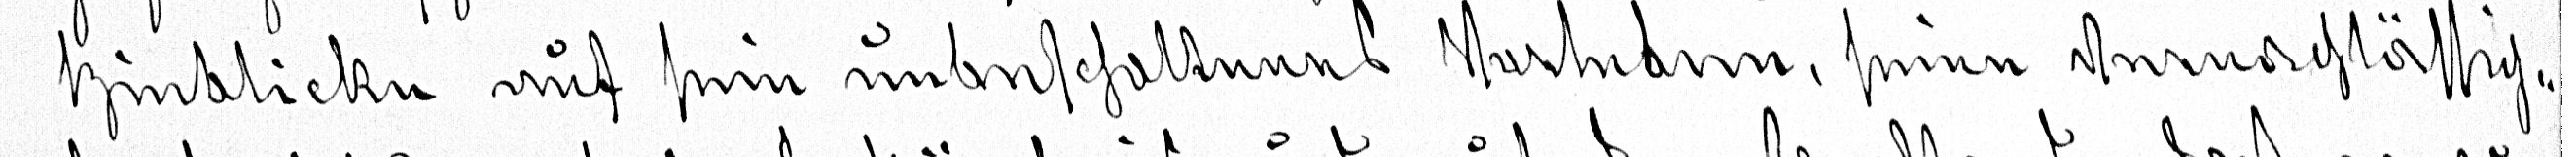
Hinblicke auf sein unbescholtenes Vorleben, seine Vernachlässig¬
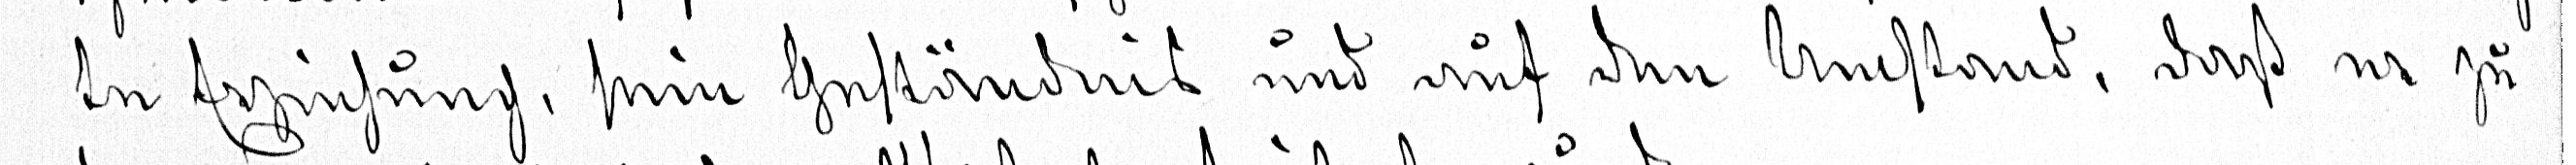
te Erziehung, sein Geständnis und auf den Umstand, daß er zu
